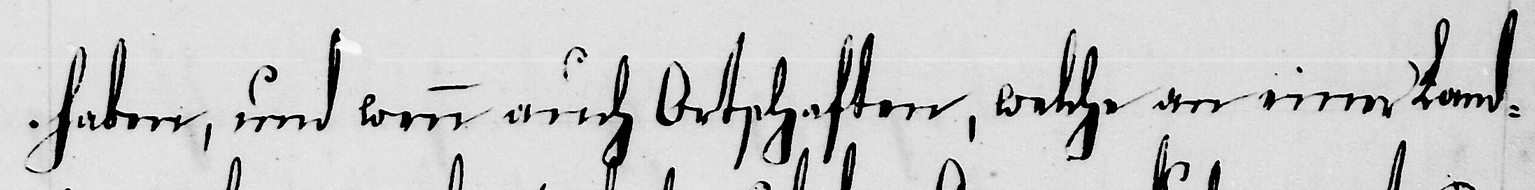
haben, und wenn auch Ortschaften, welche an einer Land¬
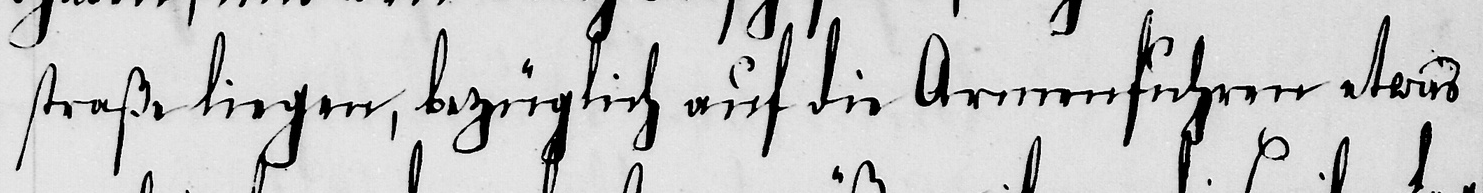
straße liegen, bezüglich auf die Armenfuhren etwas
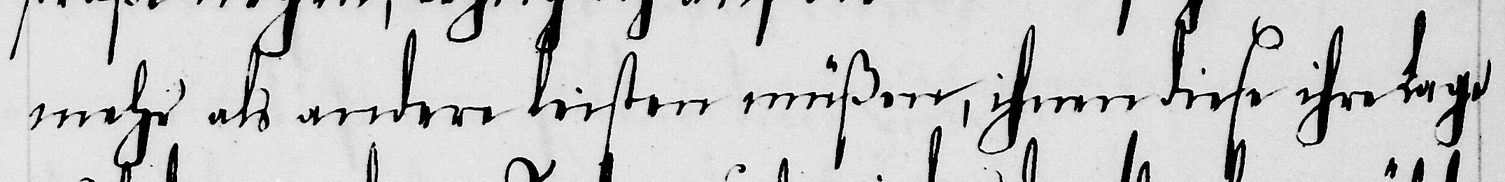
mehr als andere leisten müßen, ihnen diese ihre Lage
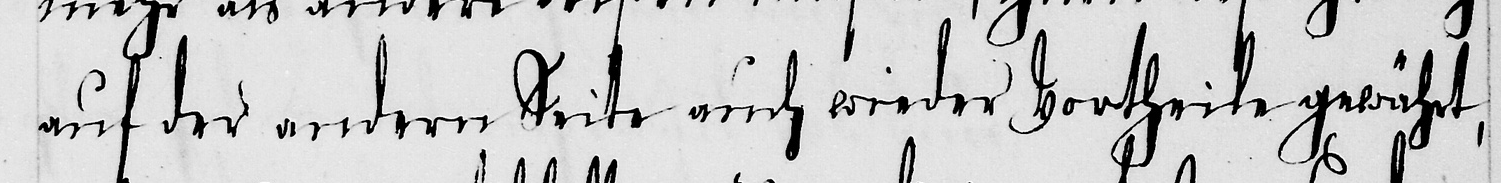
auf der andern Seite auch wieder Vortheile gewährt,
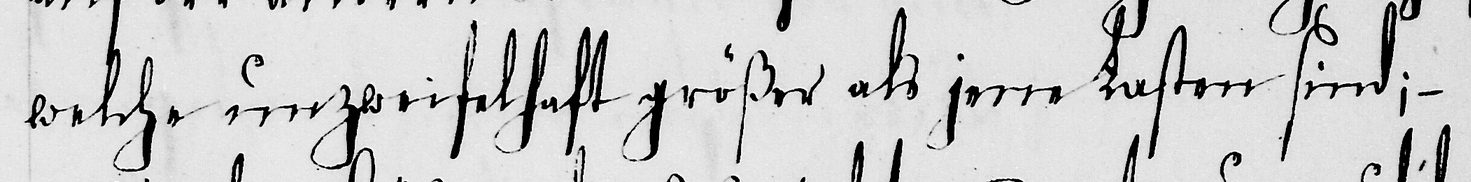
welche unzweifelhaft größer als jene Lasten sind; –
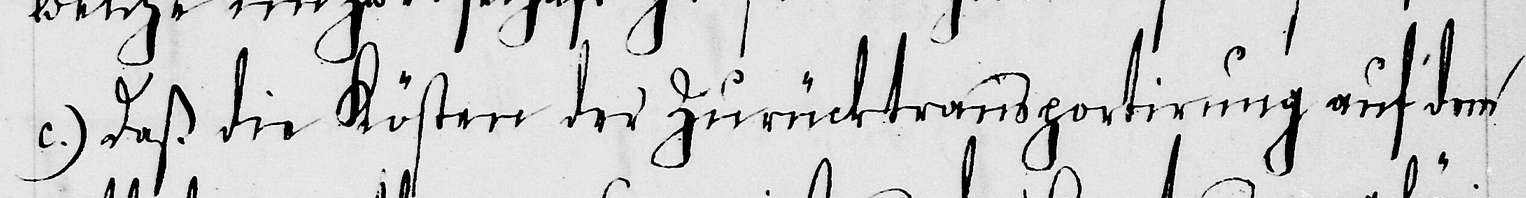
c.) Daß die Kösten der Zurücktransportirung auf dem
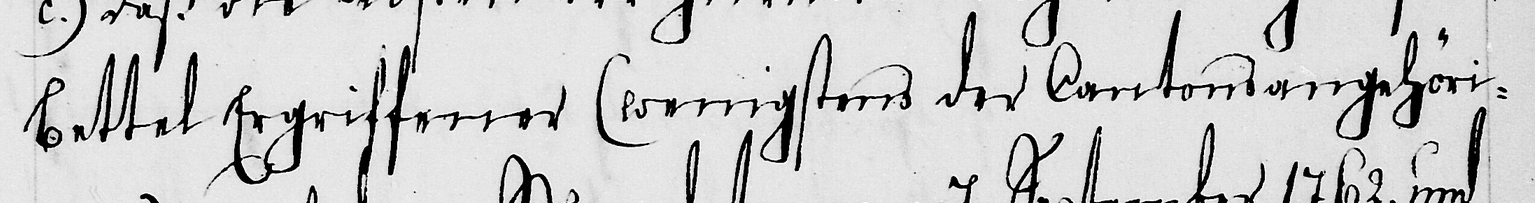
Bettel Ergriffener (wenigstens der Cantonsangehöri¬
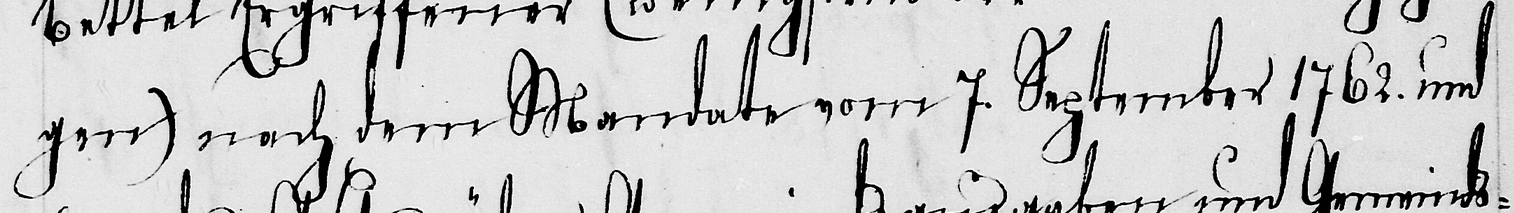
gen) nach dem Mandate vom 7. September 1762. und
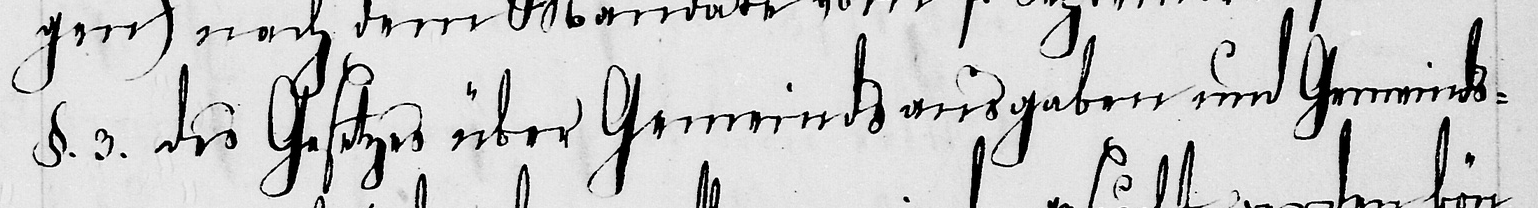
§. 3. des Gesetzes über Gemeindsausgaben und Gemeinds¬
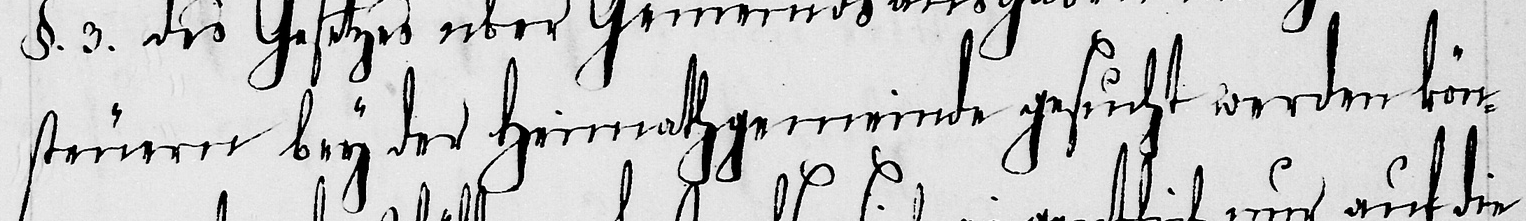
steuern bey der Heimathgemeinde gesucht werden kön¬
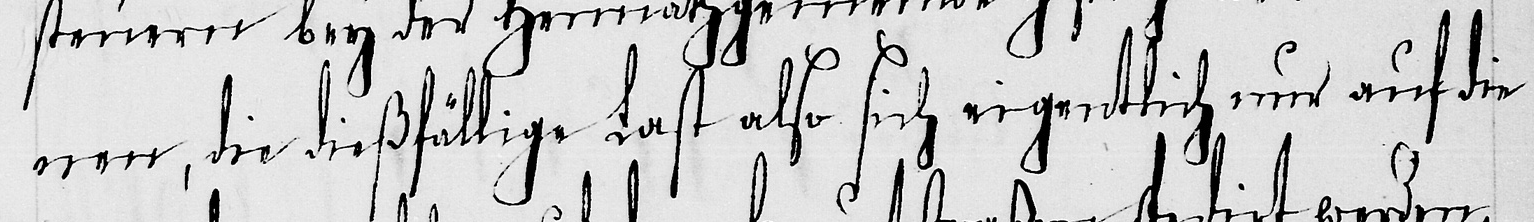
nen, die dießfällige Last also sich eigentlich nur auf die
